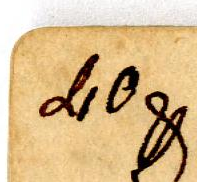40
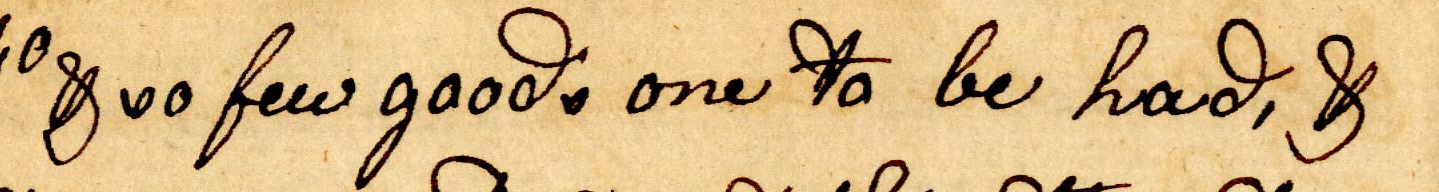& so few goods one to be had, &
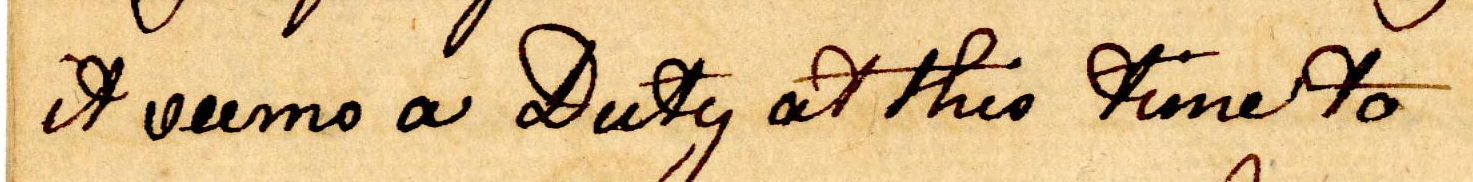it seems a Duty at this time to
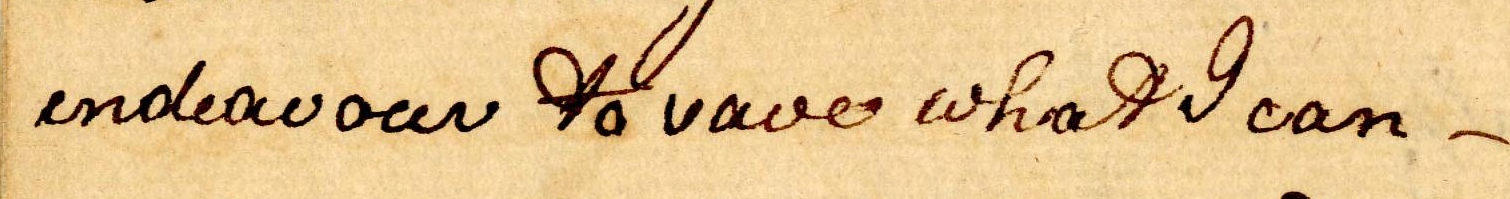endeavour to save what I can-
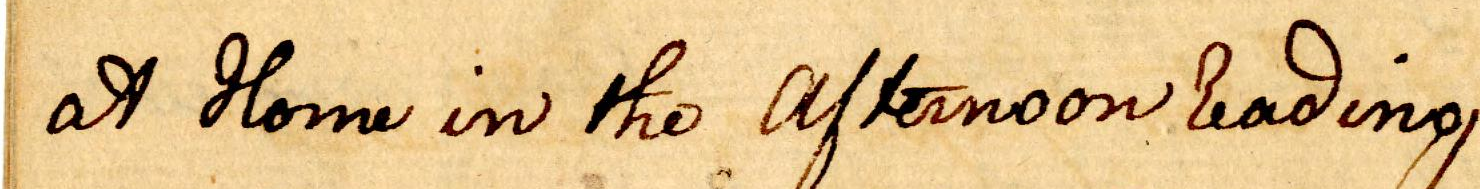at Home in the Afternoon reading
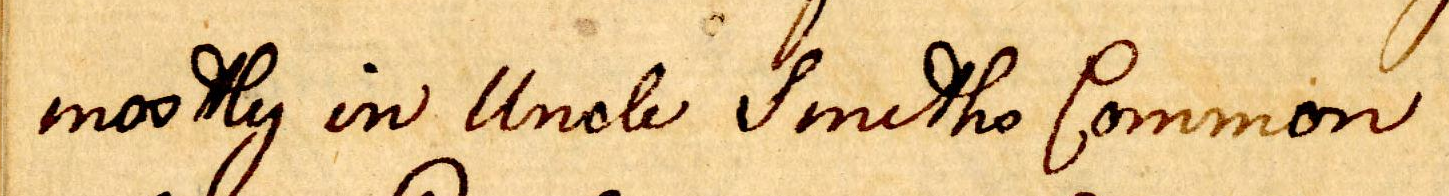mostly in Uncle Smiths Common
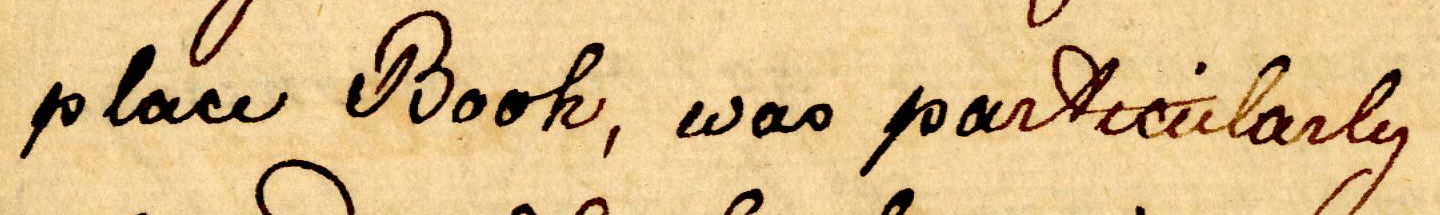place Book, was particularly
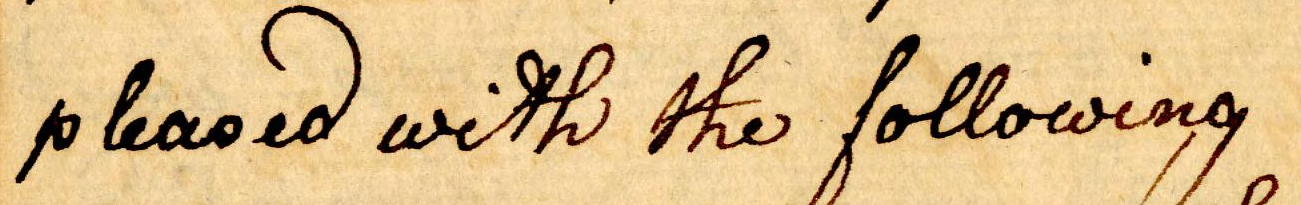pleased with the following
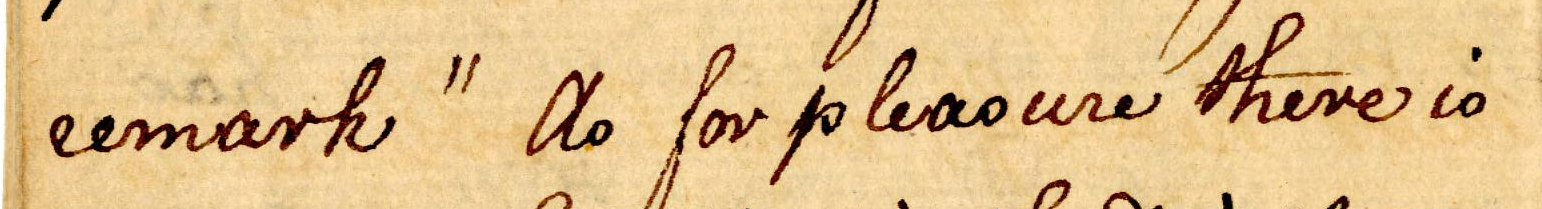remark "As for pleasure there is
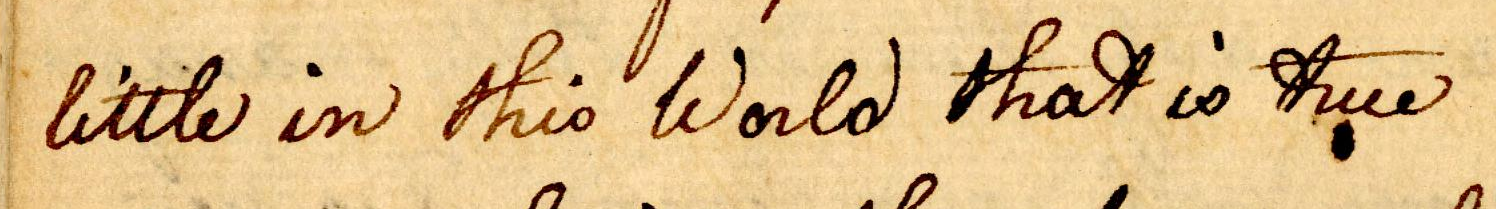little in this World that is true
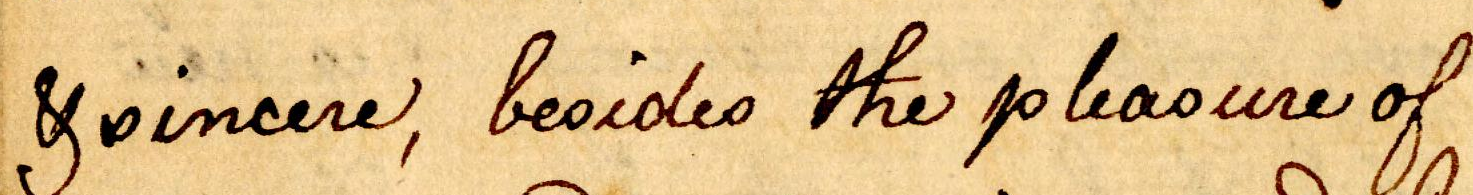& sincere, besides the pleasure of
